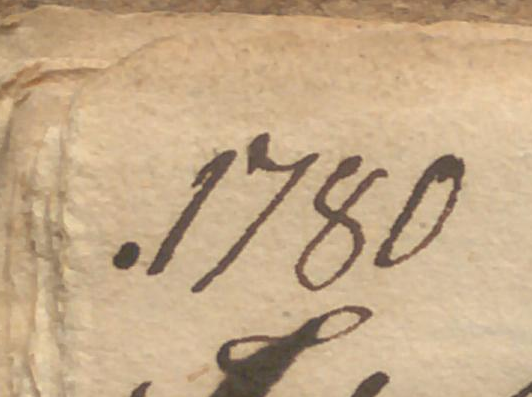1780
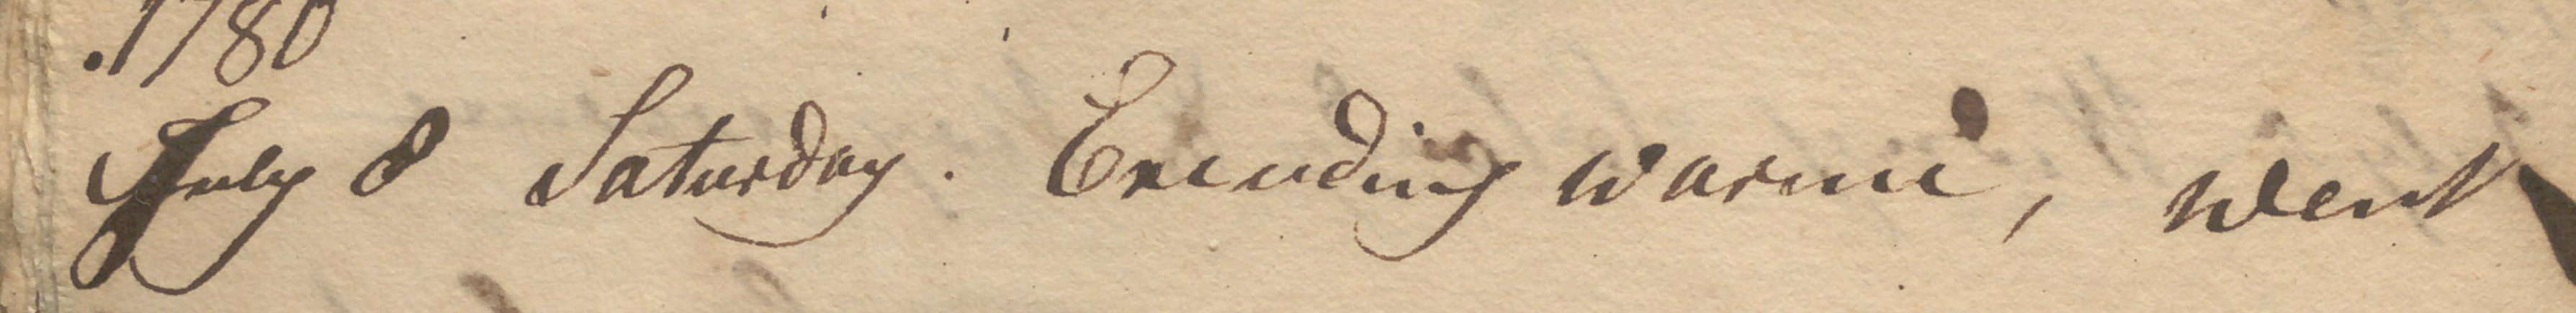July 8 Saturday. Exceding warme, went
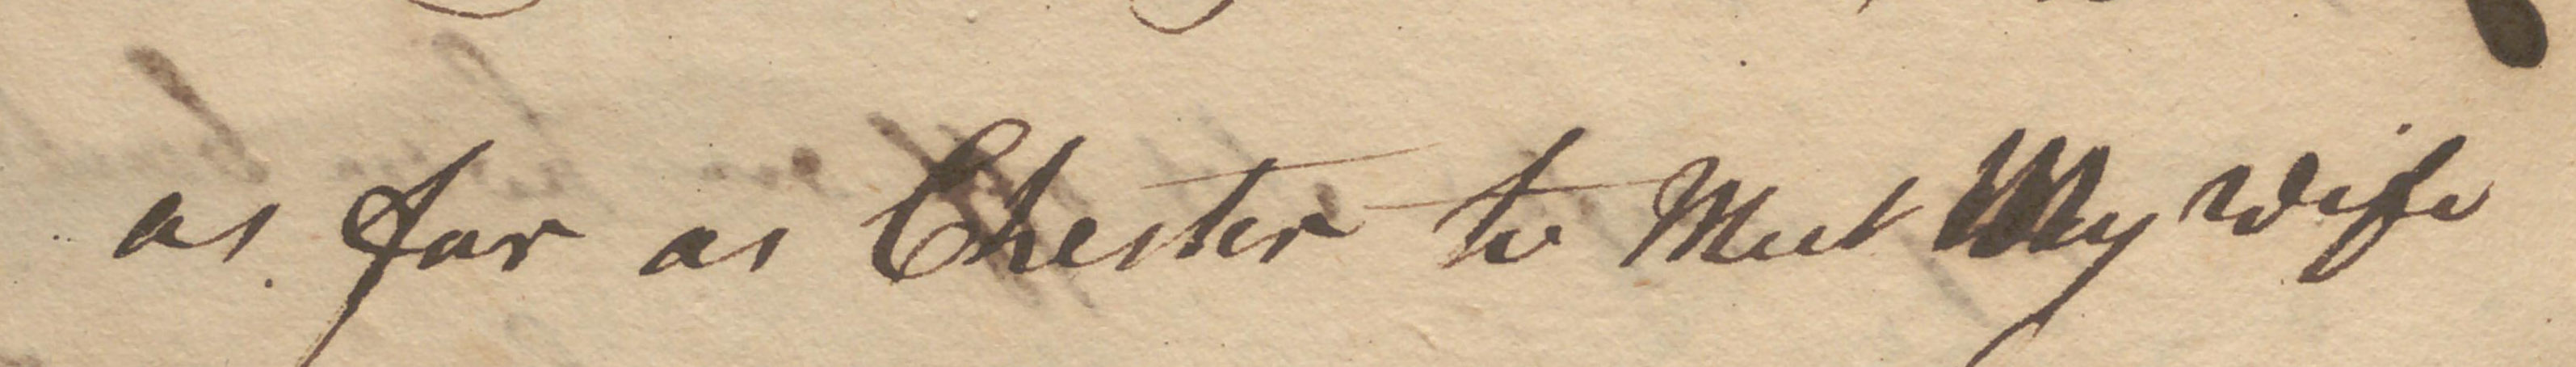as far as Chester to Meet My Wife
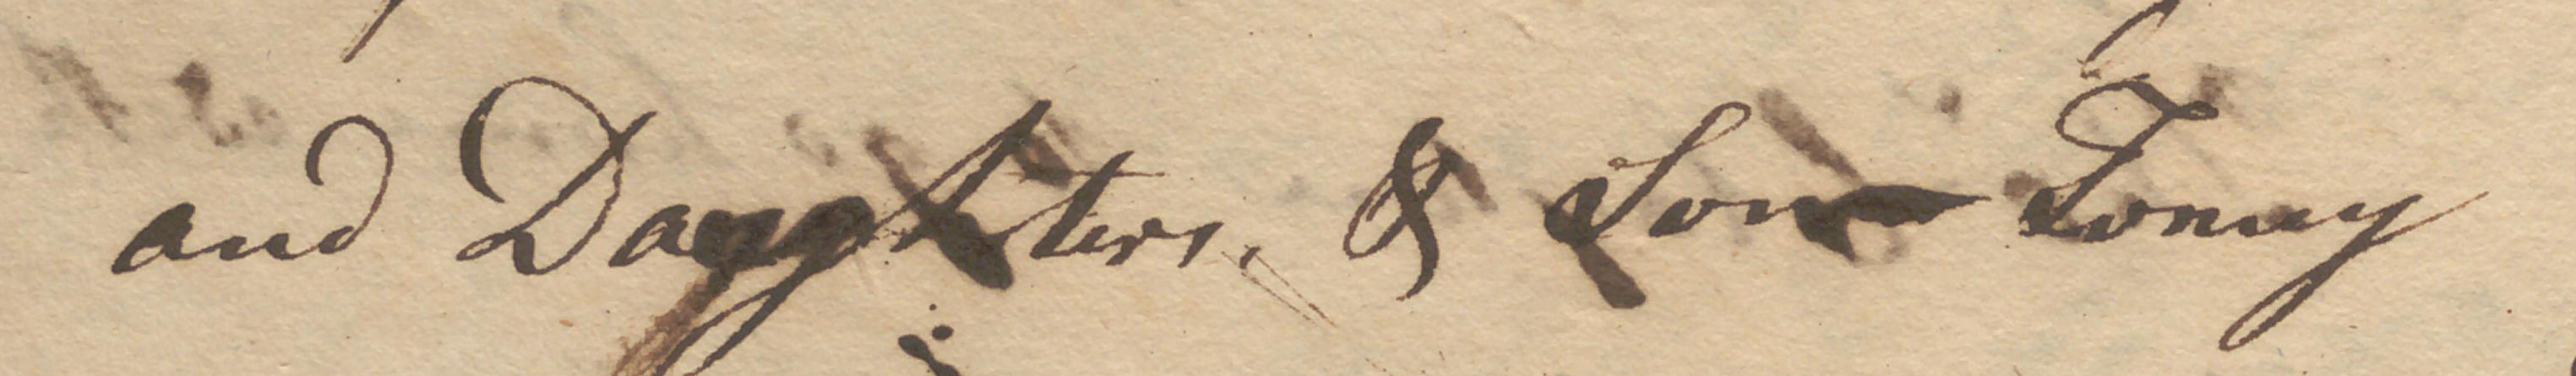and Dayghters. & son Tomey
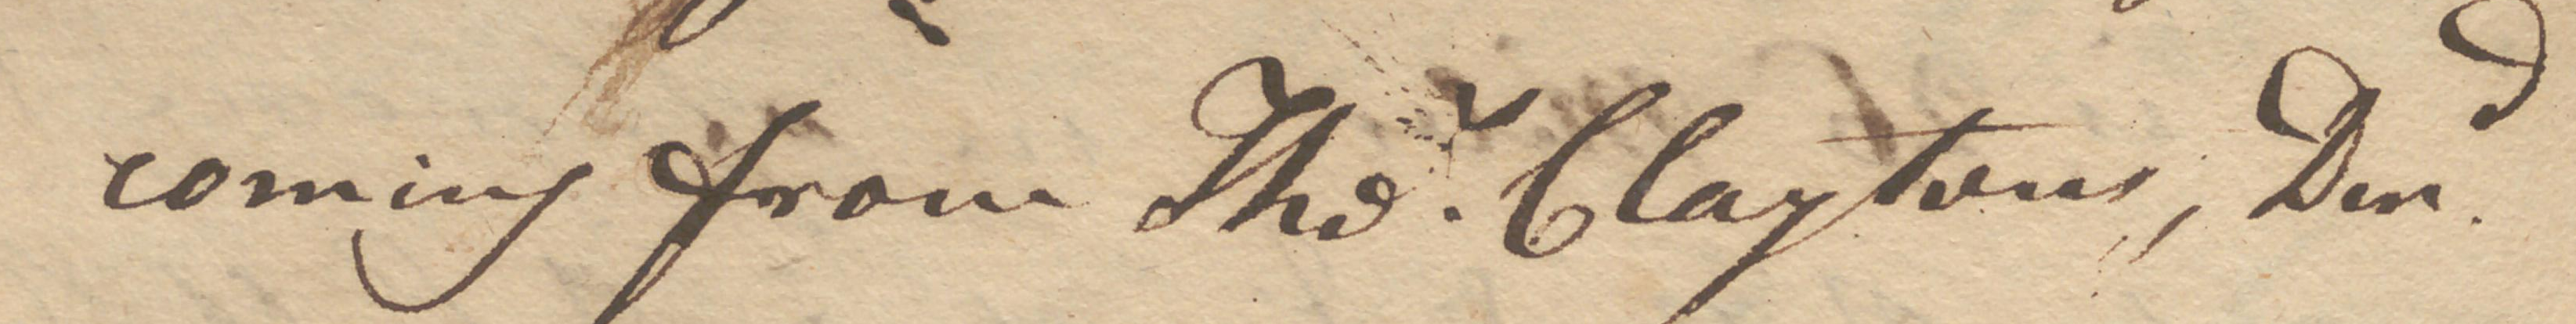coming from Tho^s. Claytons, Din^d.
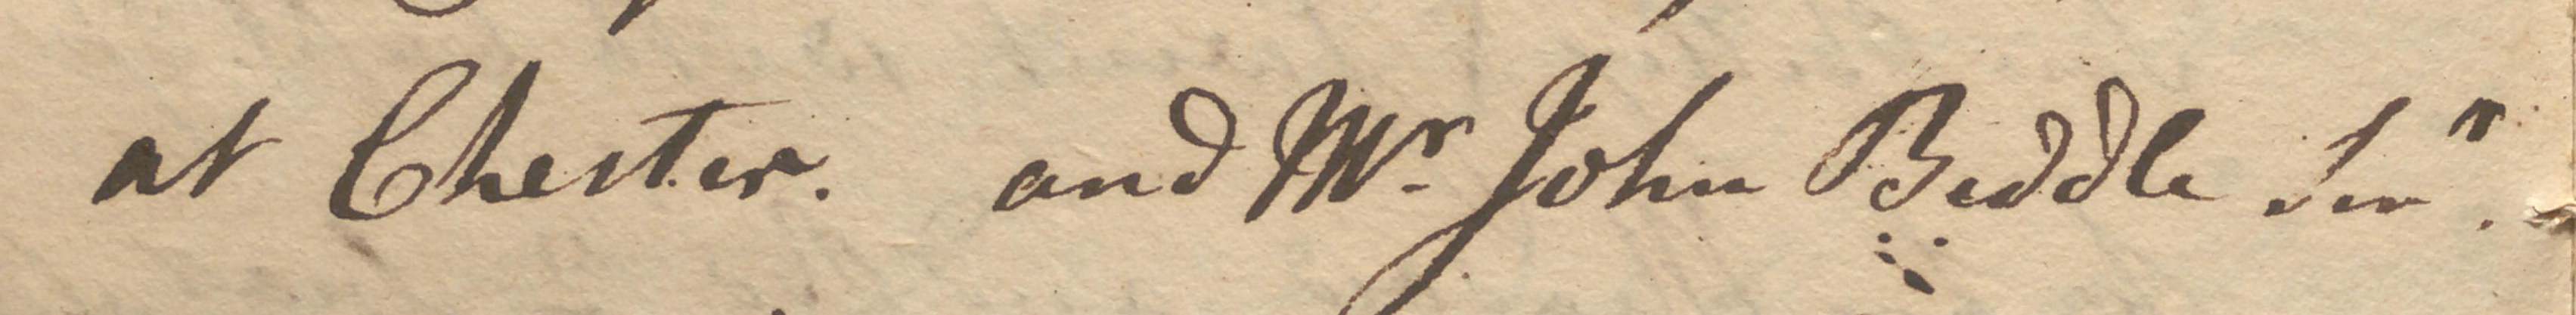at Chester. and M^r. John Biddle Sen^r.
